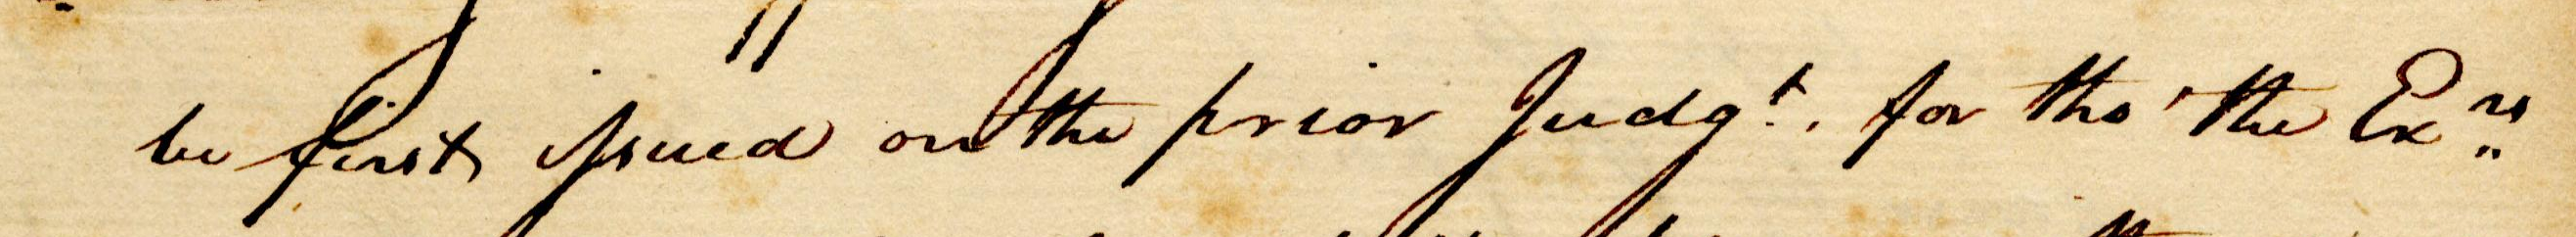be first issued on the prior Judg^t. for the the Ex^rs.
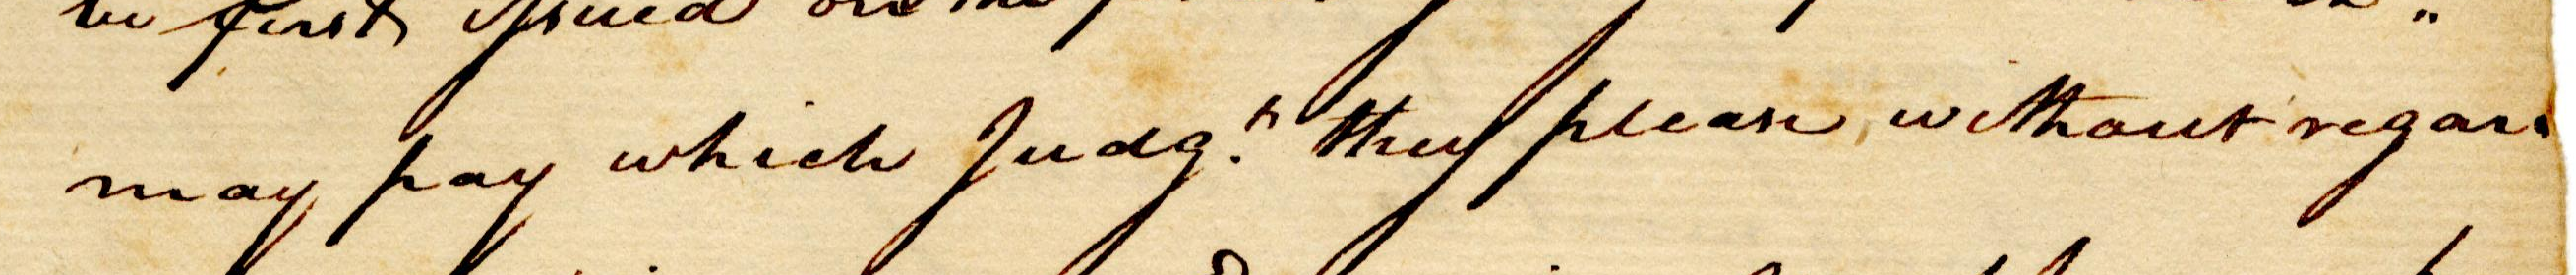may pay which Judg^t they please, without regard
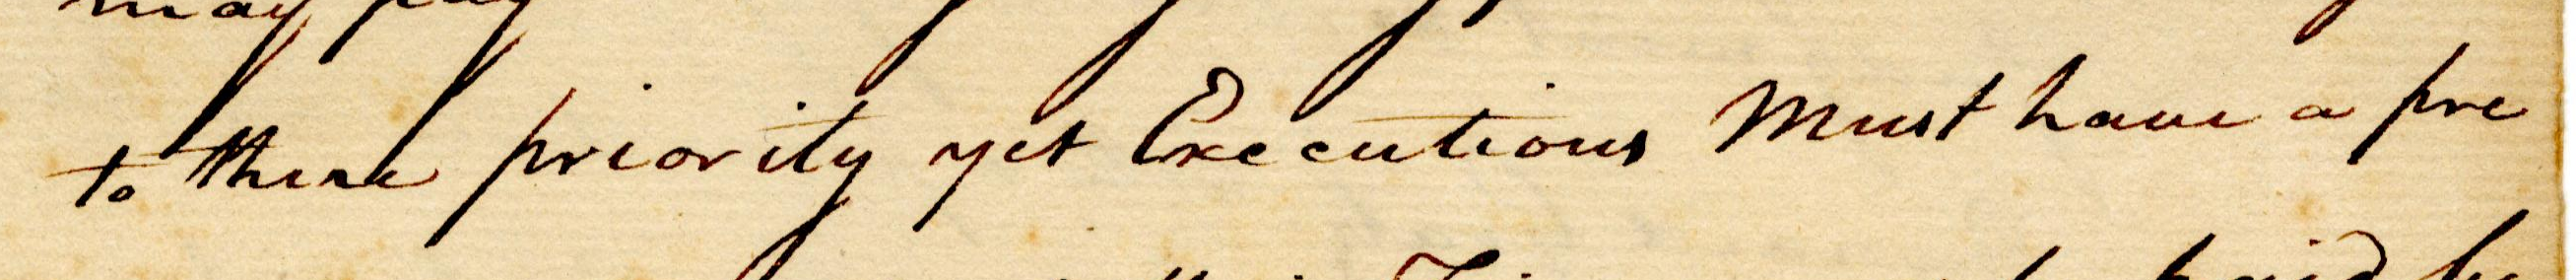to there priority yet Executions Must have a pre-
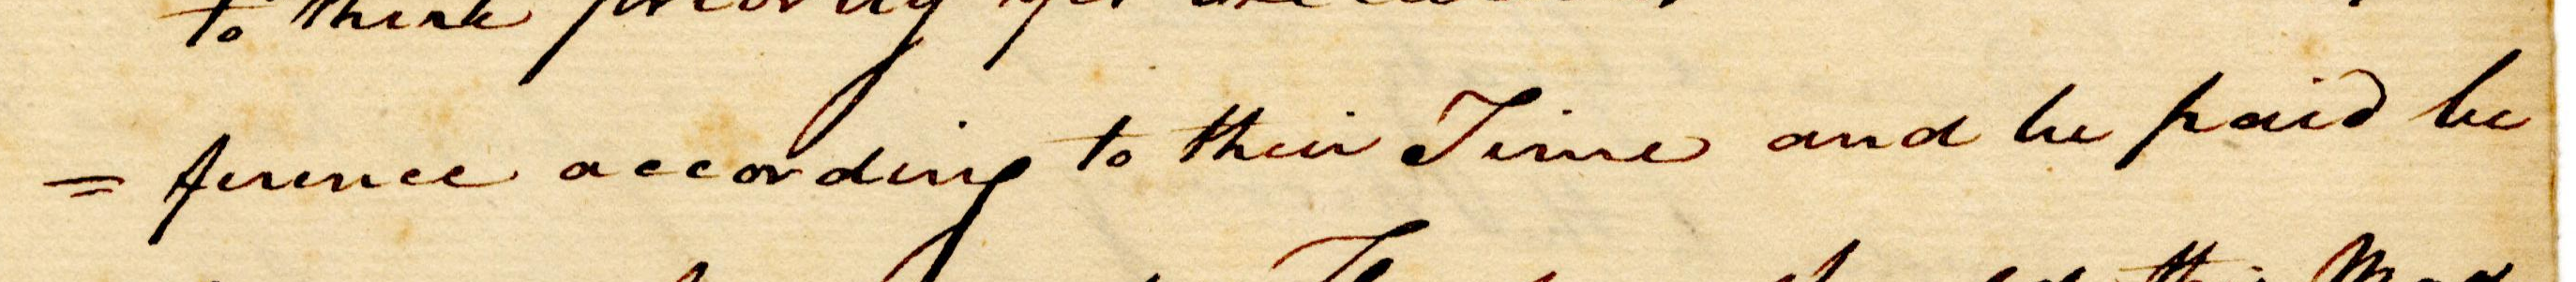-ference according to their time and be paid be-
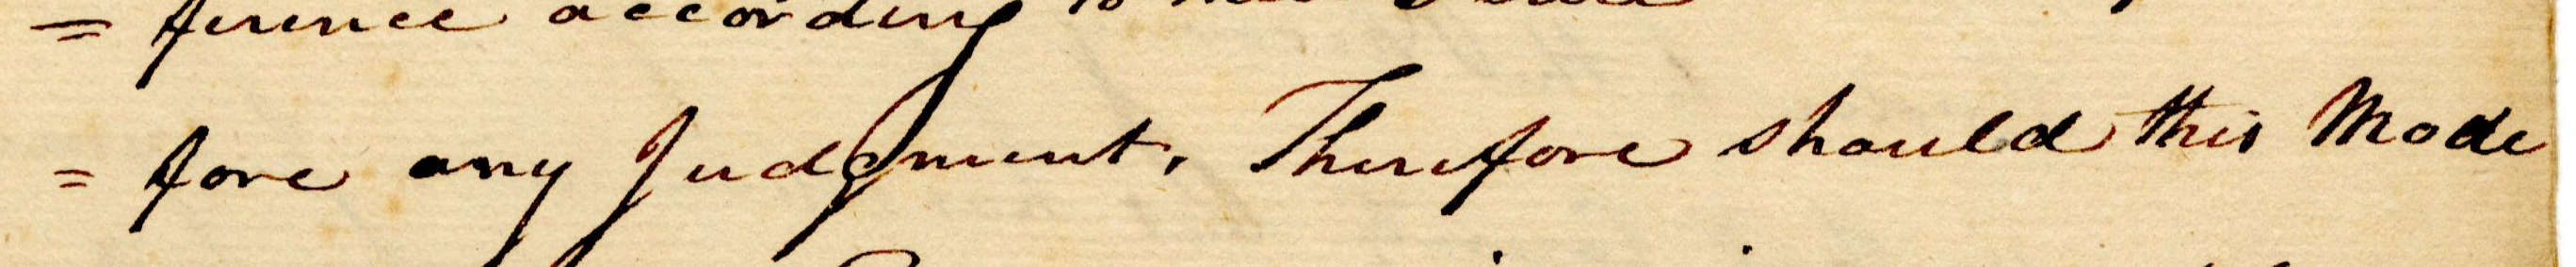-fore any Judgement, Therefore should this mode
